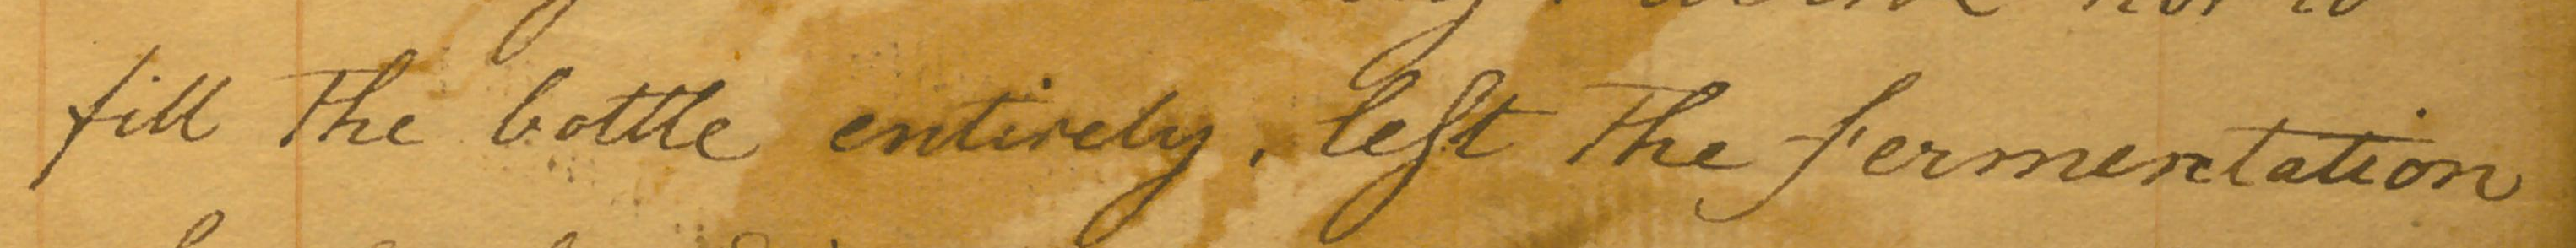fill the bottle entirely, lest the fermentation
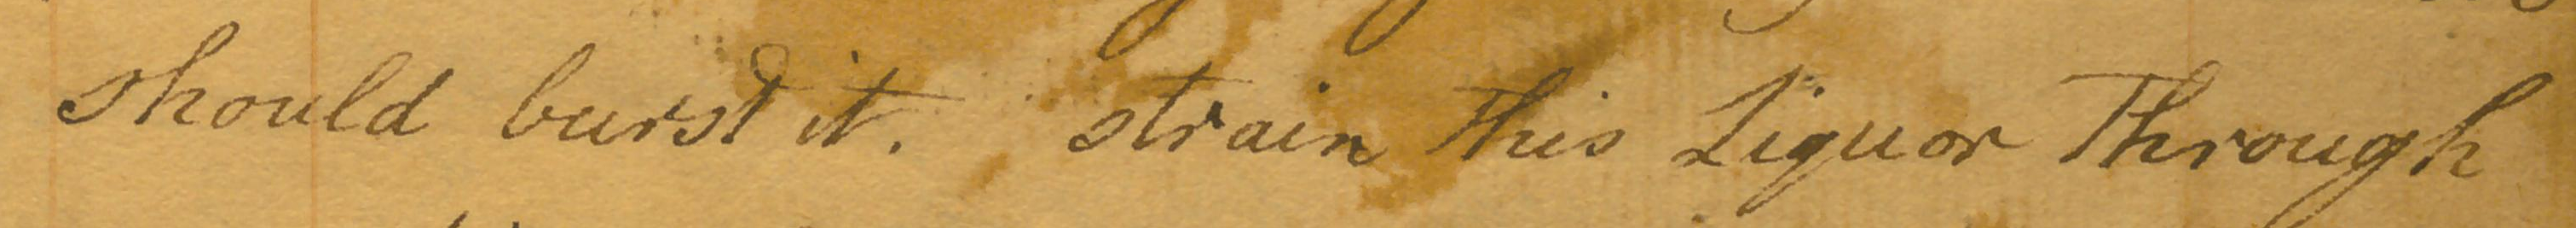should burst it. strain this Liquor through
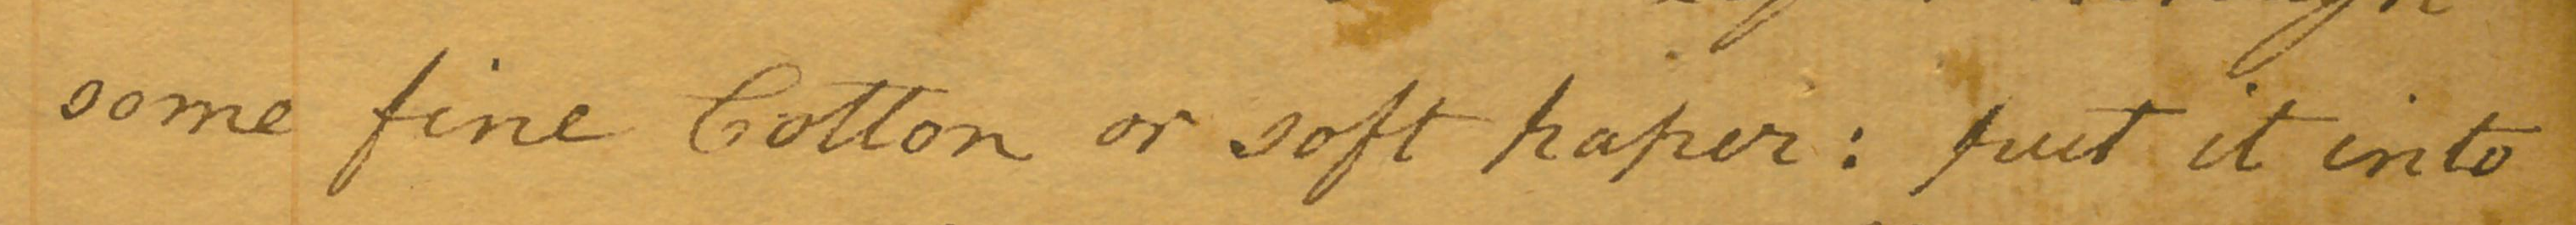some fine Cotton or soft paper: put it into
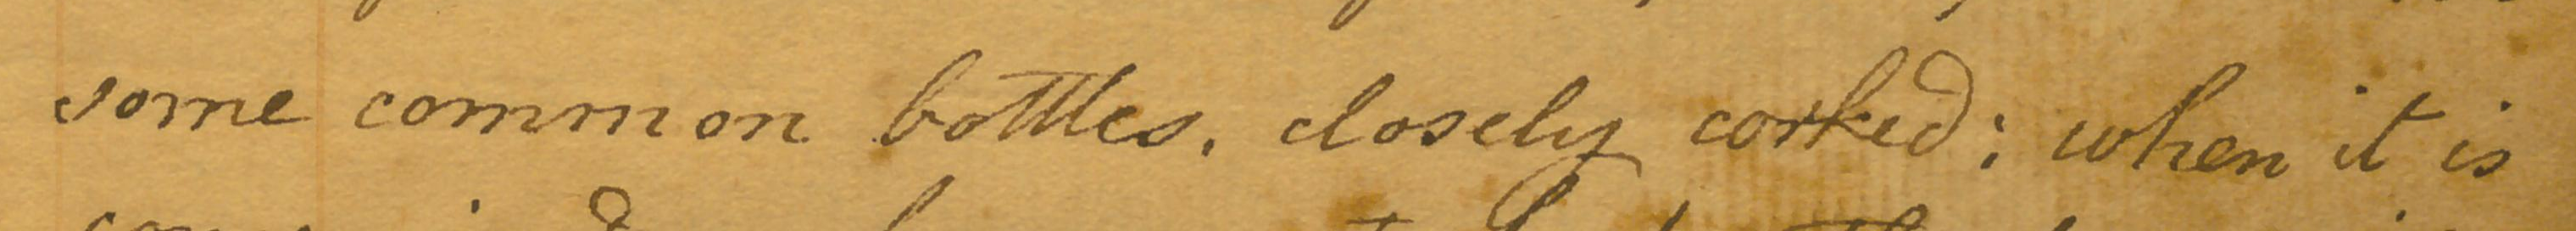some common bottles, closely corked: when it is
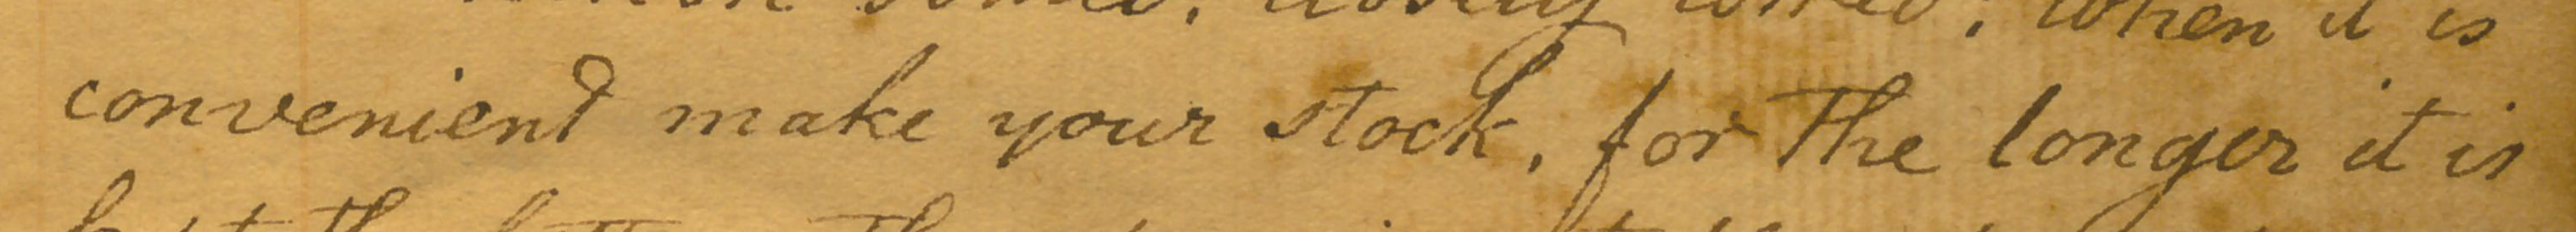convenient make your stock, for the longer it is
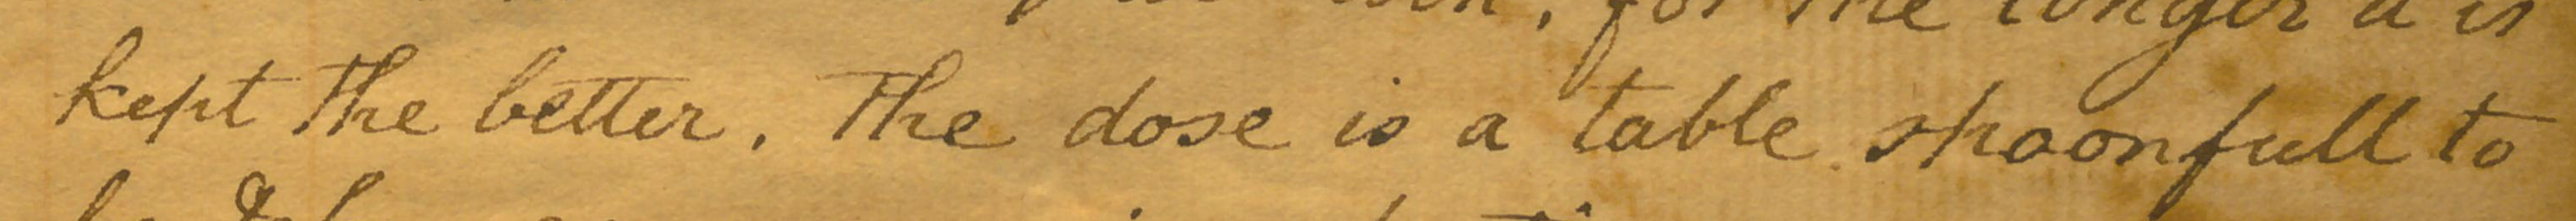kept the better. The dose is a table spoonfull to
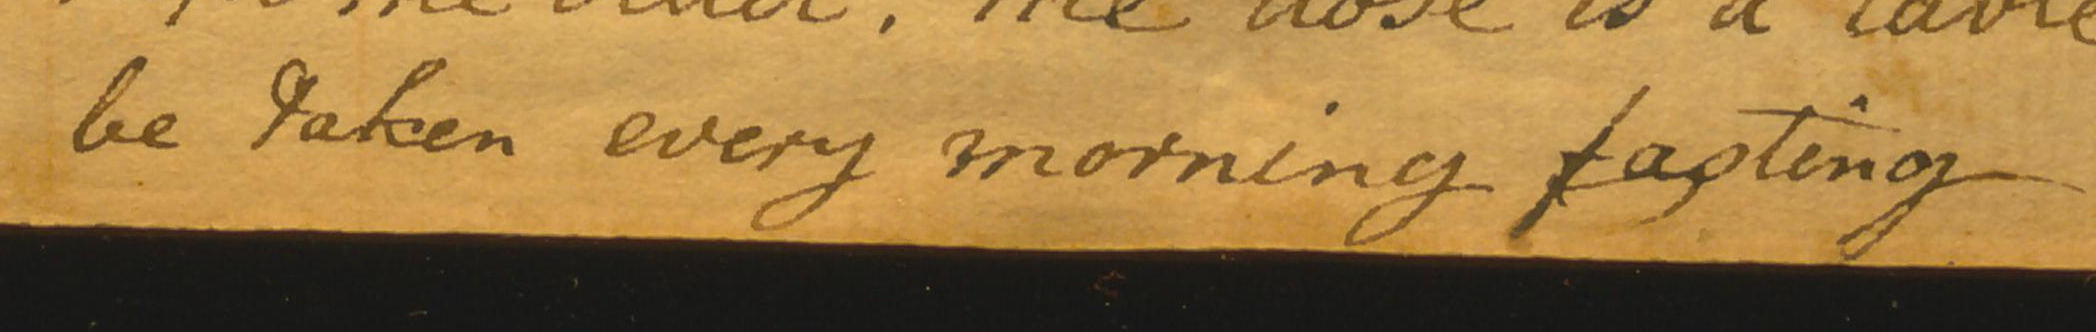be taken every morning fasting
